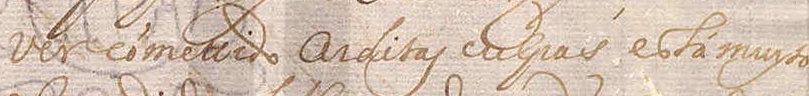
ver cōmettido as ditas culpas está muyto
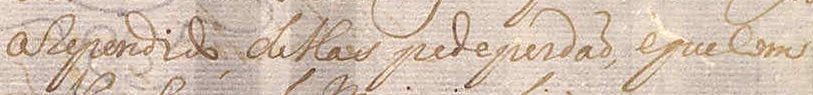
arependido, dellas pede perdaõ, e que com
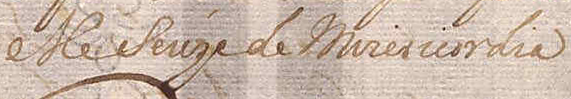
elle Se uze de Mizericordia.
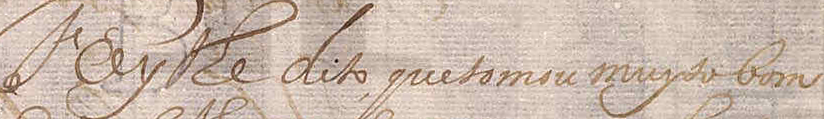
Foy lhe dito, que tomou muyto bom
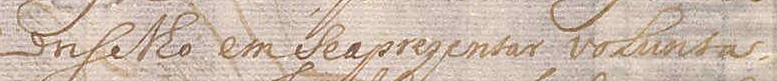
conselho em se aprezentar volunta
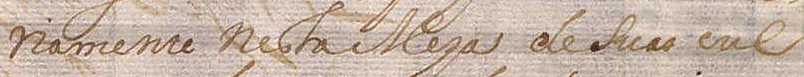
riamente nesta Meza de suas cul
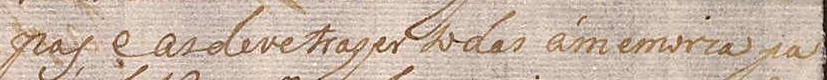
pas, e as deve trazer todas á memoria pa
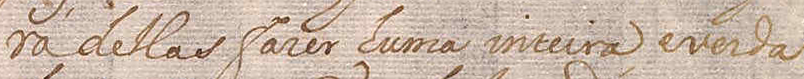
ra dellas fazer huma inteira, e verda
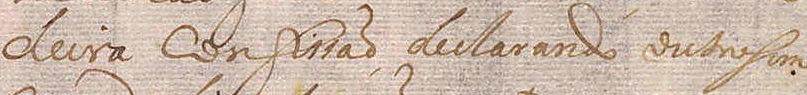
deira confissaõ, declarando outrosim
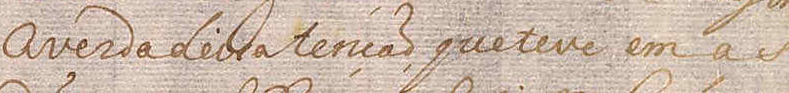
a verdadeira tençaõ, que teve em as
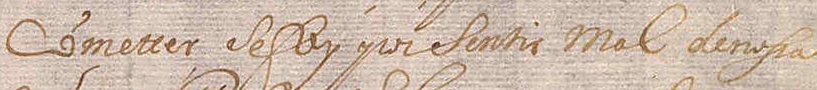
cōmetter se foy por sentir mal de nossa
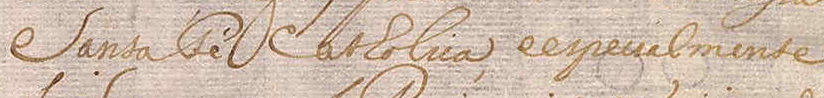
Santa Fé Catholica, e especialmente
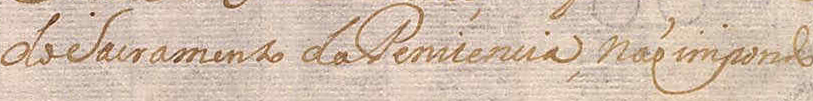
do Sacramento da Penitencia, naõ impondo
